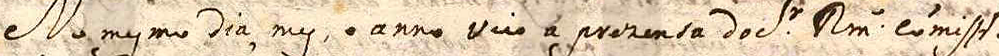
No mesmo dia, mes, e anno veio a prezensa do S.r Rm.o Cōmissr.o
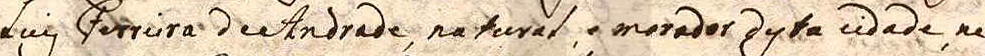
Luis Ferreira de Andrade, natural, e morador desta cidade, ne
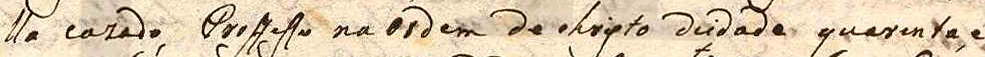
lla cazado, Proffesso na ordem de christo de idade quarenta, e
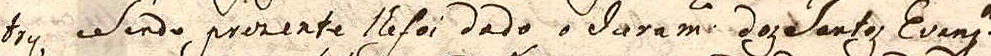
tres, e sendo prezente lhe foi dado o Iuram.to doz Santoz Evang.os
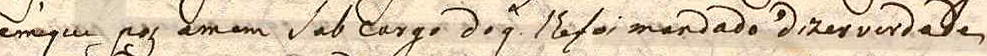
em que poz a mam sob cargo do q.L lhe foi mandado dizer verdade
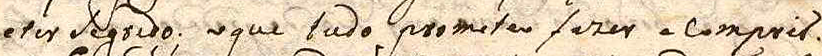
e ter segredo; o que tudo prometeo fazer e comprir.
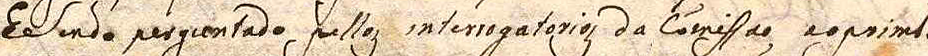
E sendo perguntado pelloz interrogatorioz da Cōmissao, ao primr.o
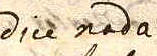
dice nada
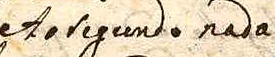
Ao segundo nada
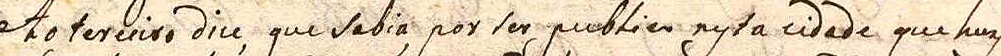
Ao terceiro dice, que sabia, por ser publico nesta cidade que huns
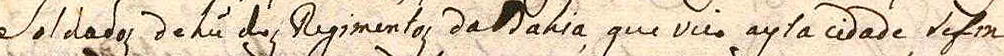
Soldadoz de hū doz Regimentoz da Bahia, que veio a esta cidade se fin
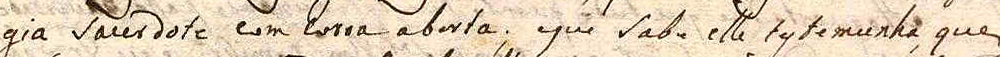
gia sacerdote com coroa aberta; e que sabe elle testemunha, que
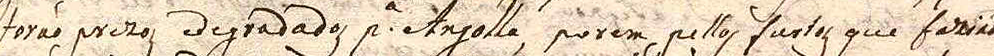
forão prezos e degradadoz p.a Angolla, porem, pellos furtoz que fazião
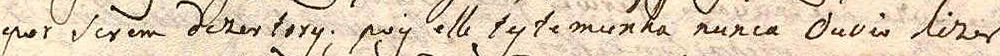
e por serem dezertores; pois elle testemunha nunca ouvio dizer
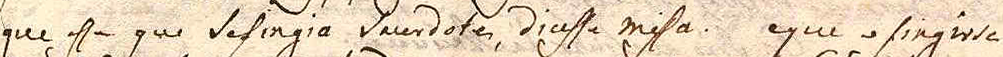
que esse que sefingia sacerdote, dicesse missa. e que o fingirse
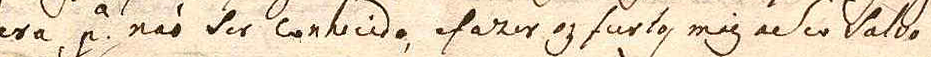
era p.a naõ ser conhecido, e fazer oz furtos mas a ser salvo
